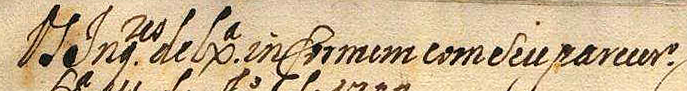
OS Inq.res de lx.a informem com seu parecer.
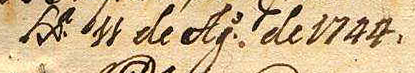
lx.a 11 de Ag.o de 1744.
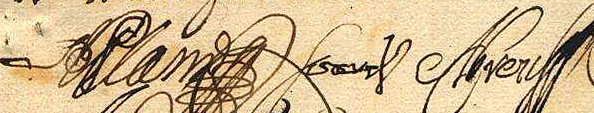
lant̄e Sores Abreu
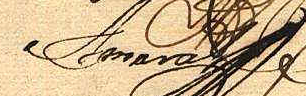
Amaral
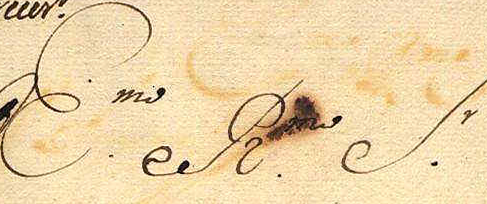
E.mo e R.mo S.r
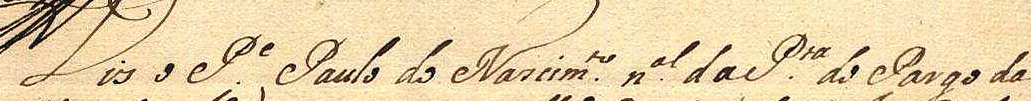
Dis o P.e Paulo do Nascim.to n.al da P.ta do Pargo da
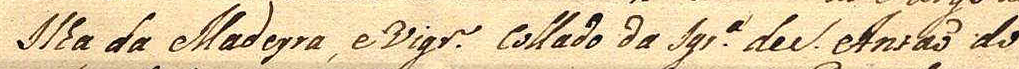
Ilha da Madeyra, e Vigr.o collado da Igr.a de S. Antaõ do
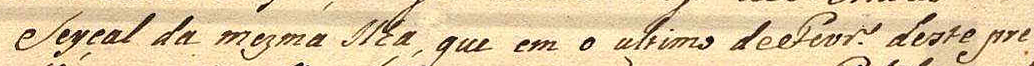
Seyçal da mezma Ilha, que em o ultimo de Fevr.o deste pre
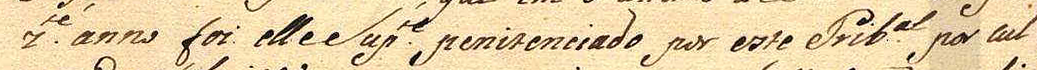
z.te anno foi elle Sup.te penitenciado por este Trib.al por cul
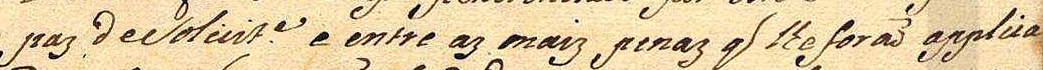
paz de Solicit.a e entre az maiz penaz q̄ lhe foraõ applica
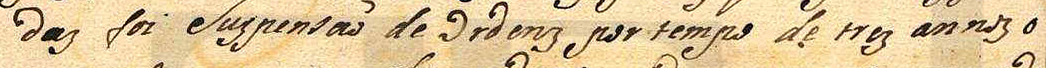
daz foi Suzpensaõ de Ordenz por tempo de trez annoz o
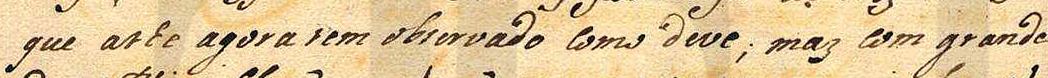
que athe agora tem observado como deve, maz com grande
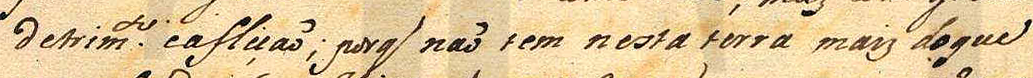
detrim.to e afliçaõ; porq̄ naõ tem nesta terra maiz do que
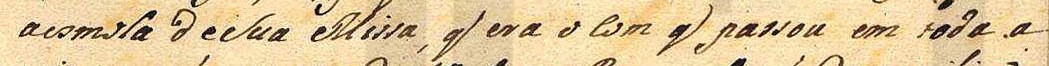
a esmola de sua Missa, q̄ era o com q̄ passou em toda a
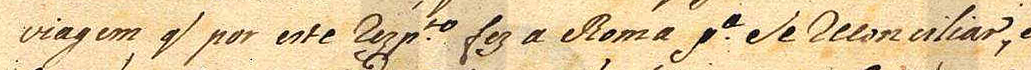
viagem q̄ por este Rezp.to fez a Roma p.a se Reconciliar, e
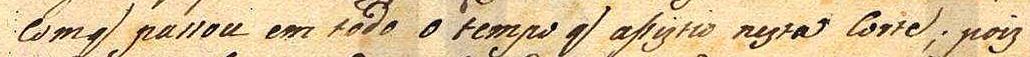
com q̄ passou em todo o tempo q̄ assiztio nezta corte; poiz
